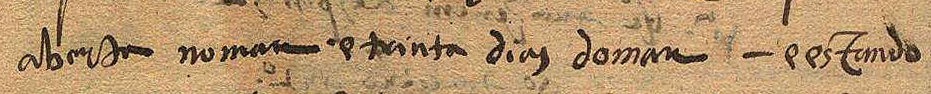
aberta no mar e trinta dias do mar — e estando
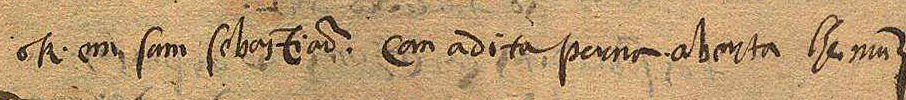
o R. em sam sebastião Com a dita perna aberta lhe mā
